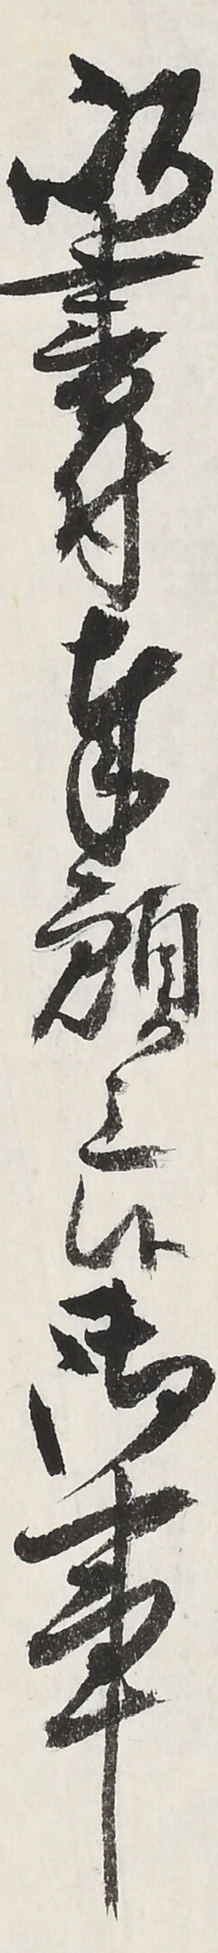以書付奉願上候御事
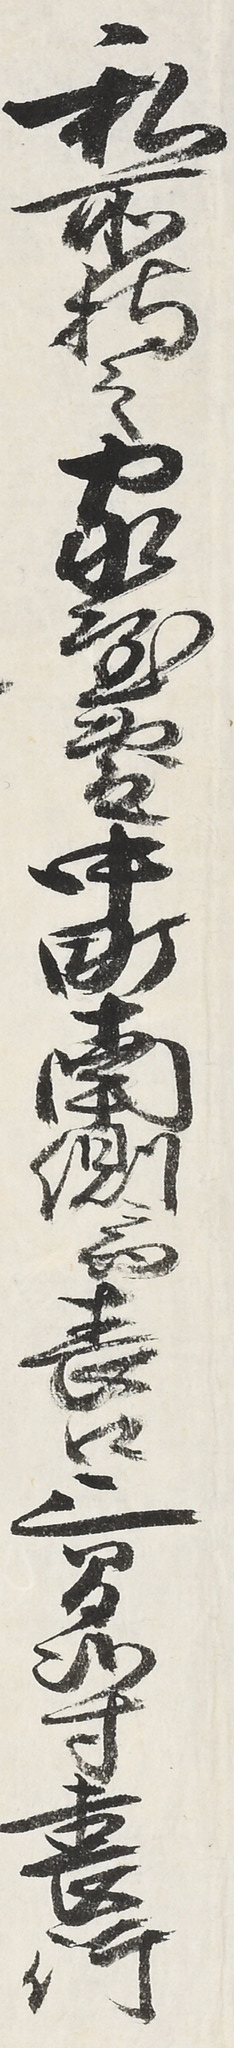私所持之家屋敷中町南側ニ而表口三間弐寸裏行
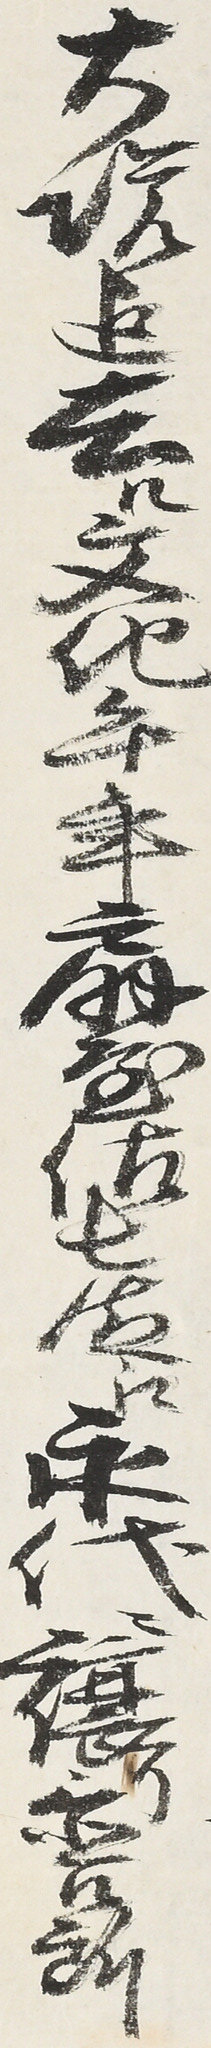大境迄去ル文化午年扇屋佐七殿江永代ニ譲り置候所
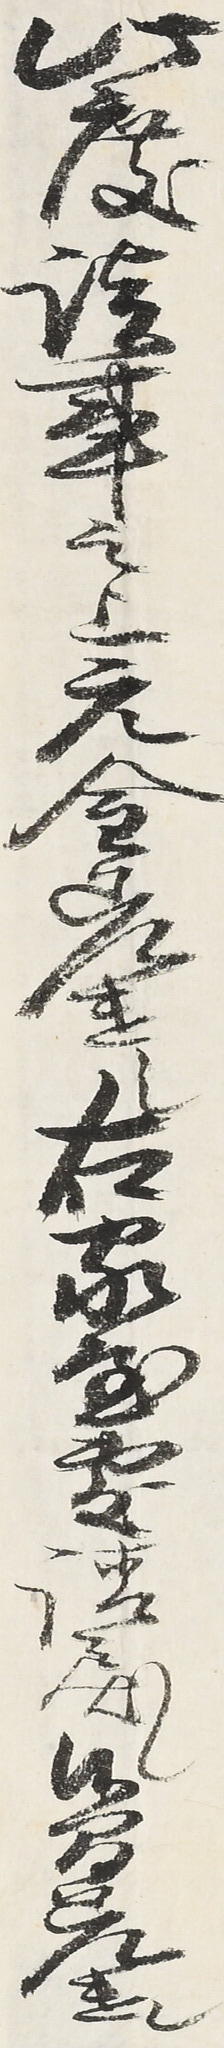此度諸事之上元金差遣し右家屋敷請戻し候間差遣し
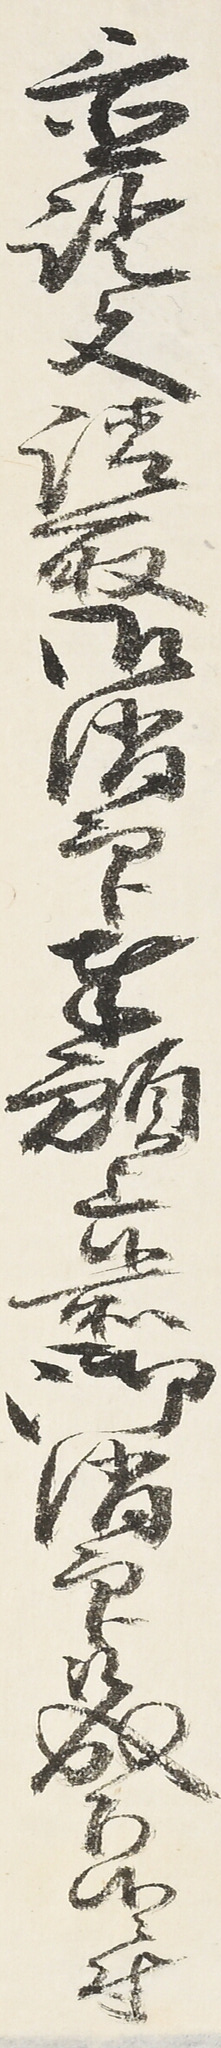置証文請取御消印奉願上候所御消印被成下候ニ付
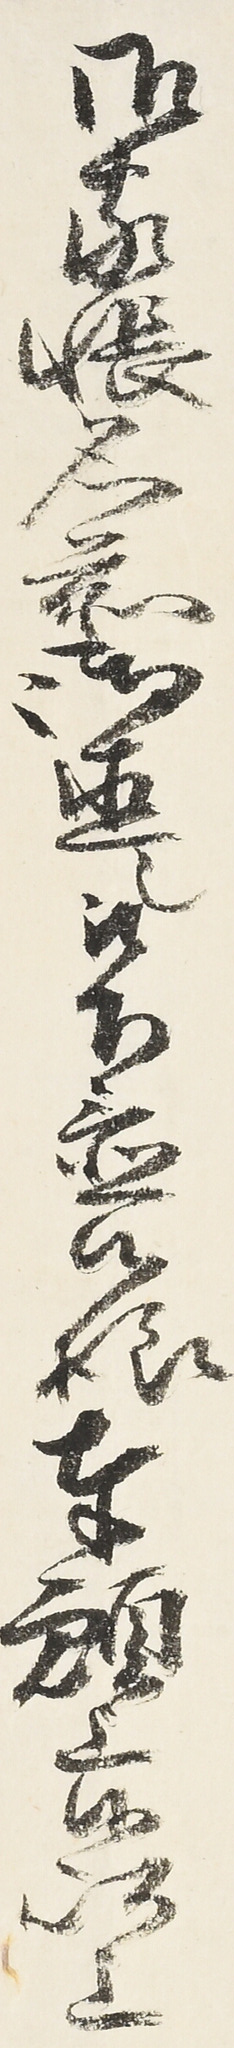御家帳名前御直し被下置候様奉願上候以上
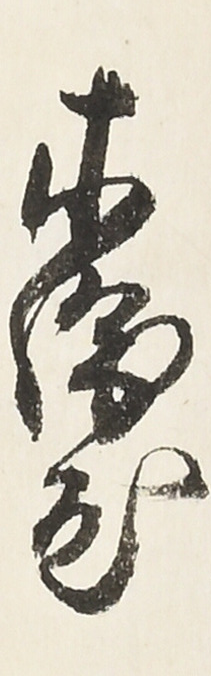木綿屋
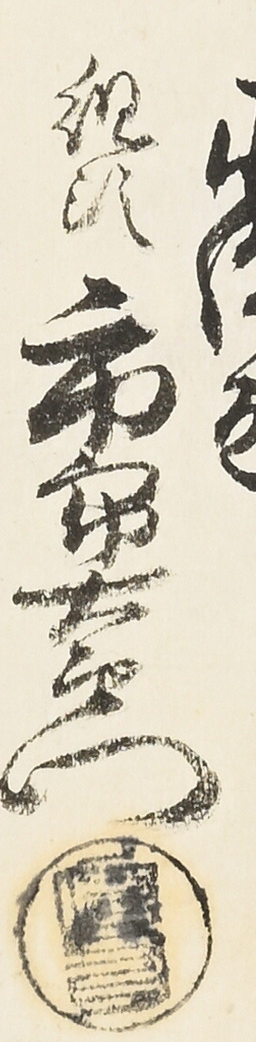組頭市郎右衛門㊞
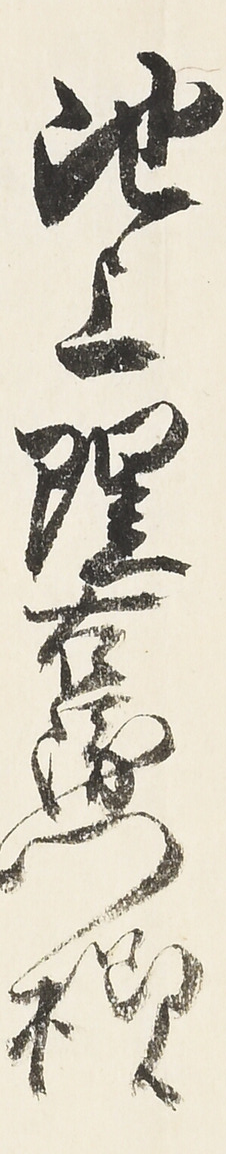池上理右衛門様
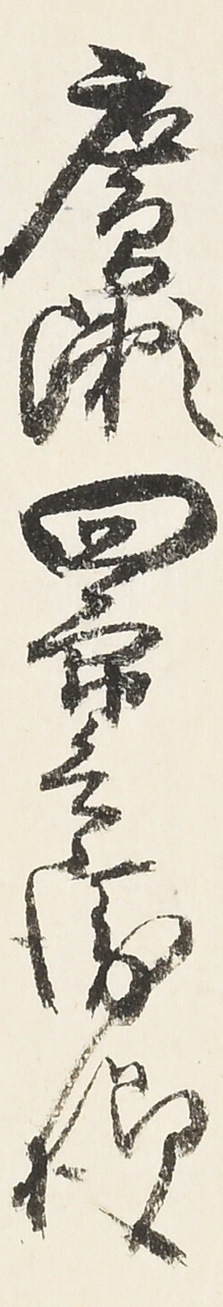広瀬四郎兵衛様
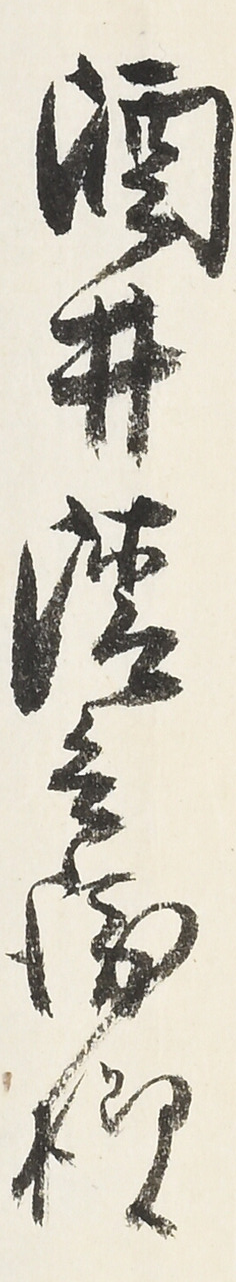酒井清兵衛様
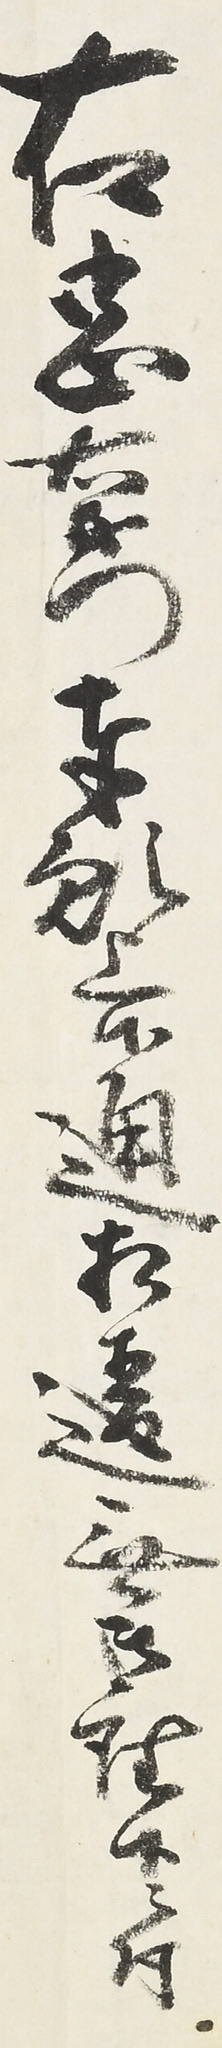右忠右衛門奉願上候通相違無御座候ニ付
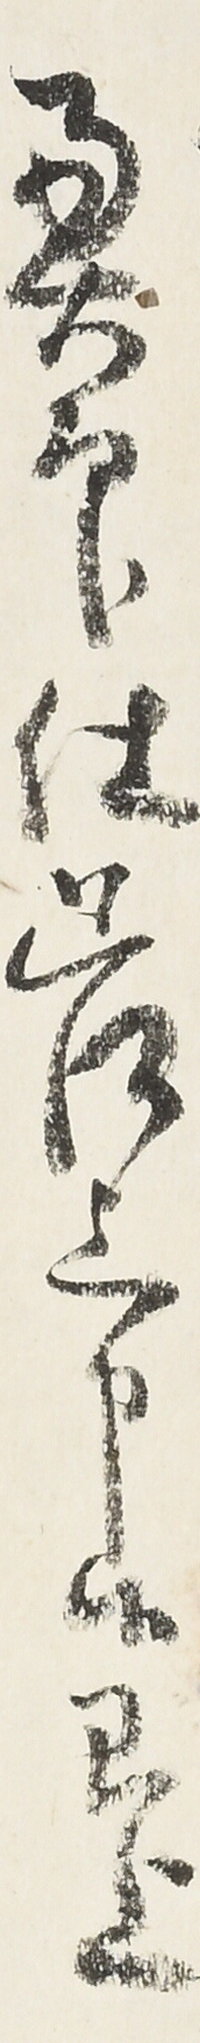奥印仕差上申候已上
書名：以書付奉願上候御事
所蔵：伊那市立高遠町図書館・合同会社AMANE
